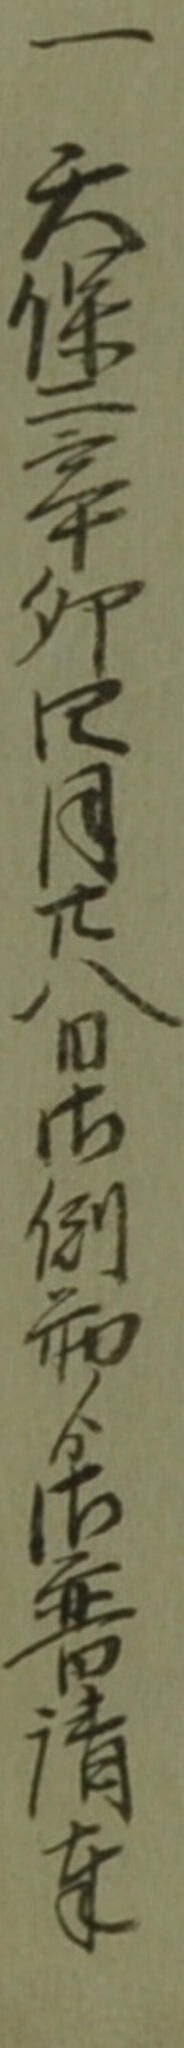一天保二辛卯四月廿八日御側勤ゟ御普請奉
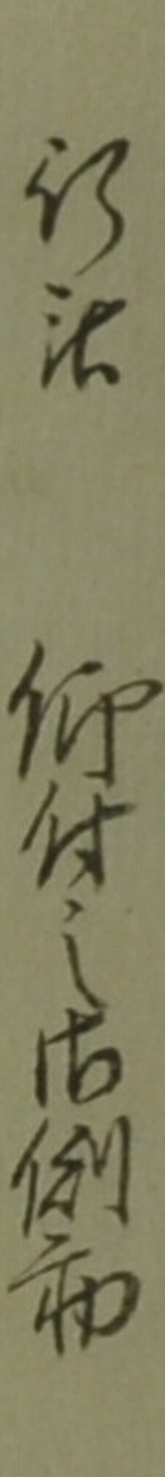行被仰付之御側勤
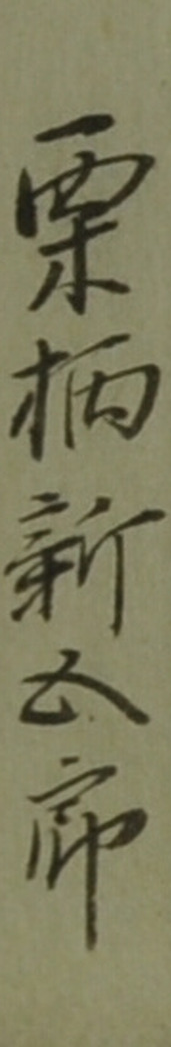栗栖新五郎
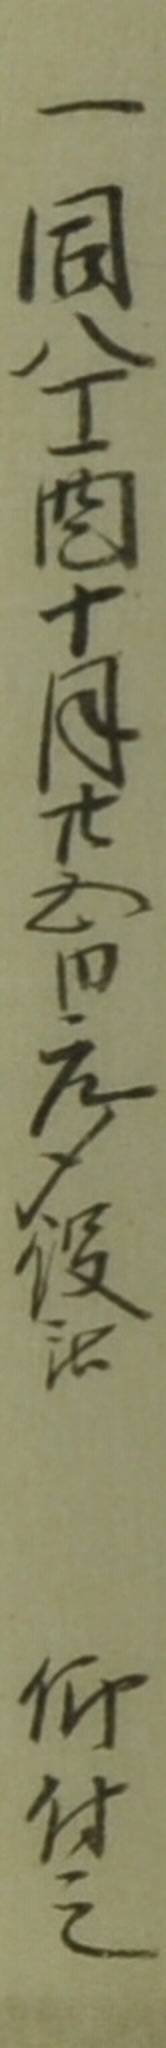一同八丁酉十月廿五日元〆役被仰付之
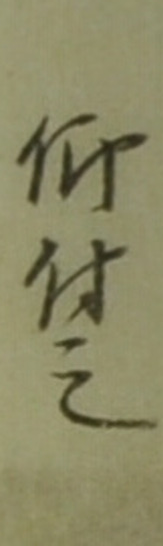仰付之

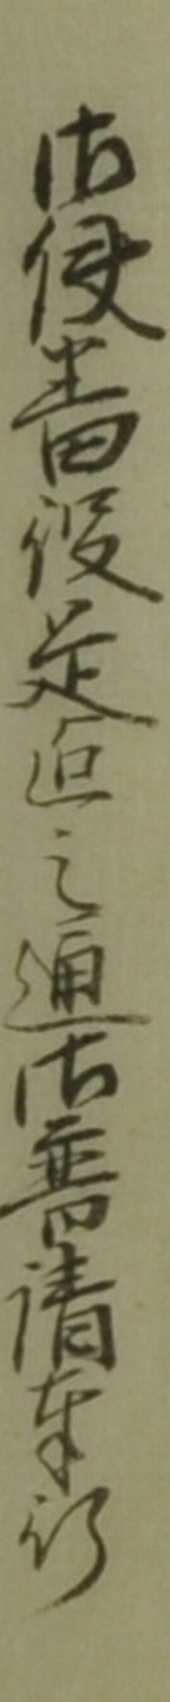御使番役是迄之通御普請奉行
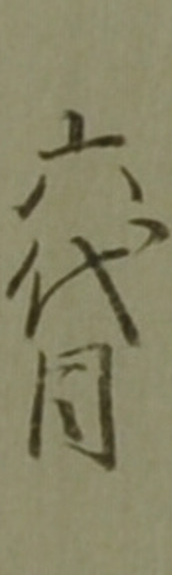六代目
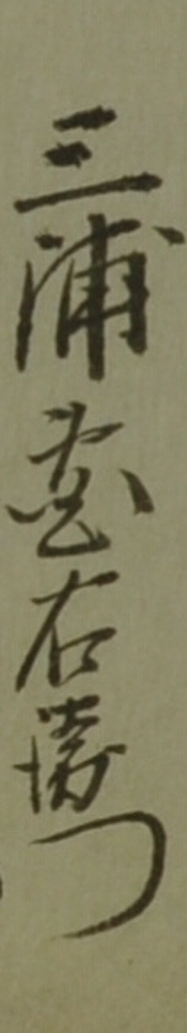三浦団右衛門
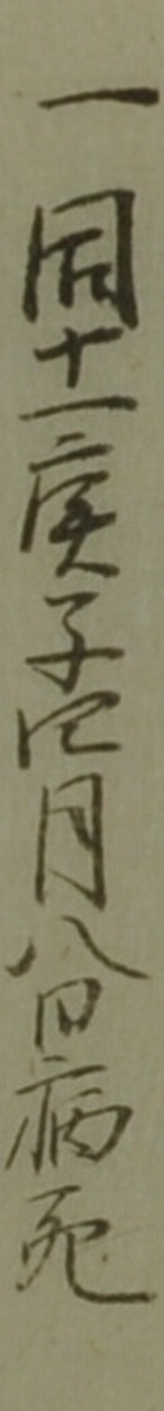一同十一庚子四月八日病死
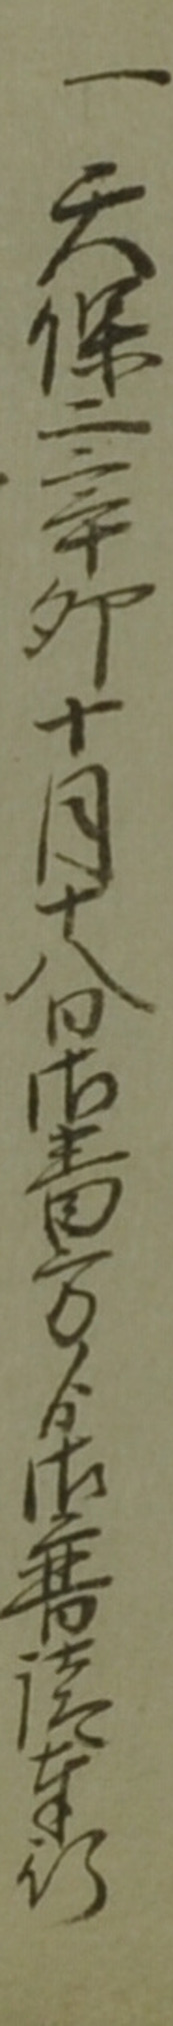一天保二辛卯十月十八日御番方ゟ御普請奉行
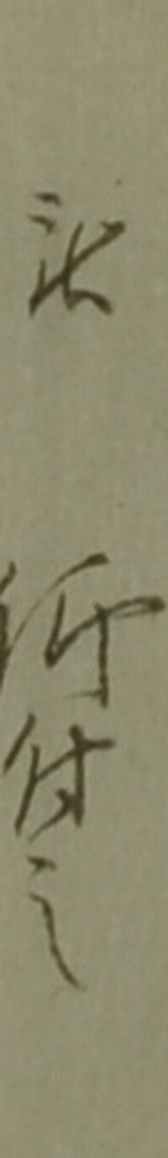被仰付之
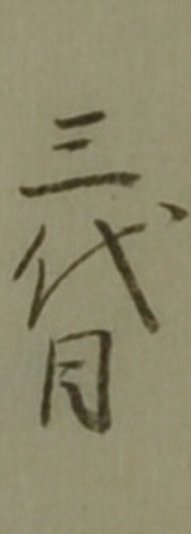三代目
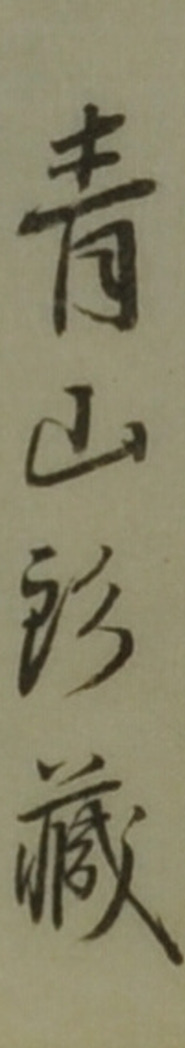青山釤蔵
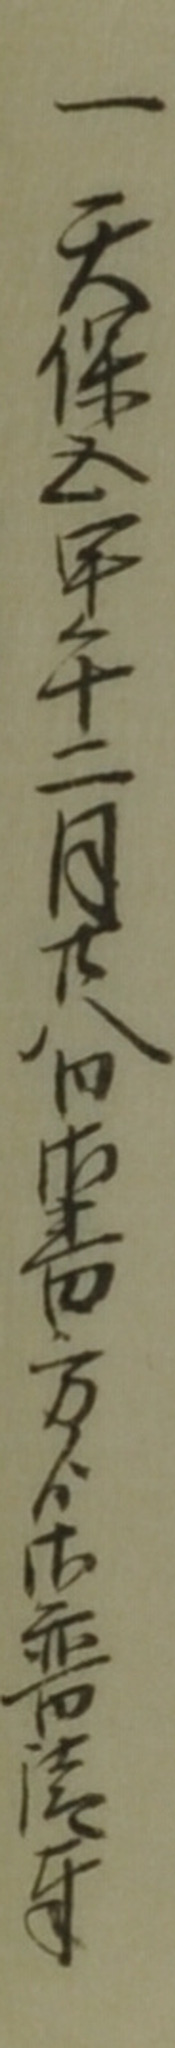一天保五甲午二月廿八日御番方ゟ御普請奉
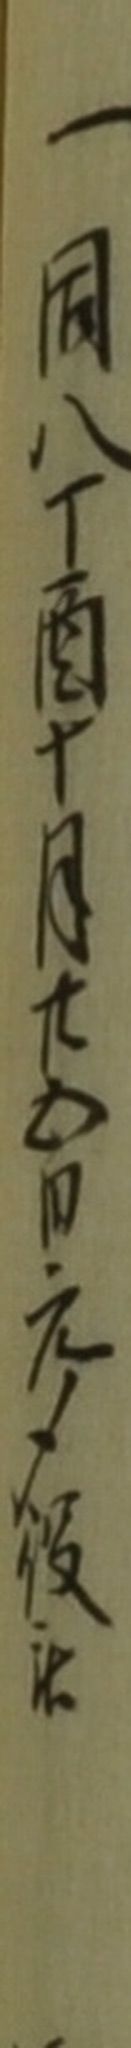一同八丁酉十月廿五日元〆役被仰付之
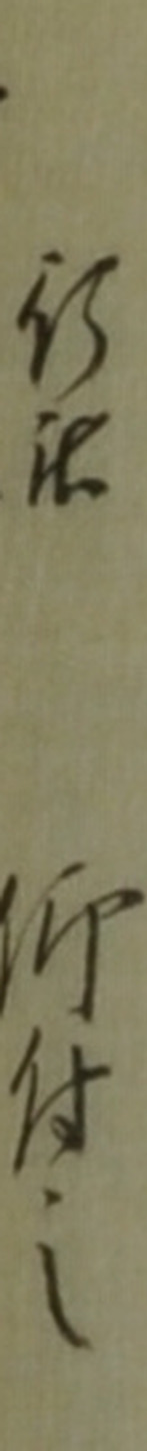行被仰付之
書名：諸御役代々録（六）
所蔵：伊那市立高遠町図書館・合同会社AMANE
